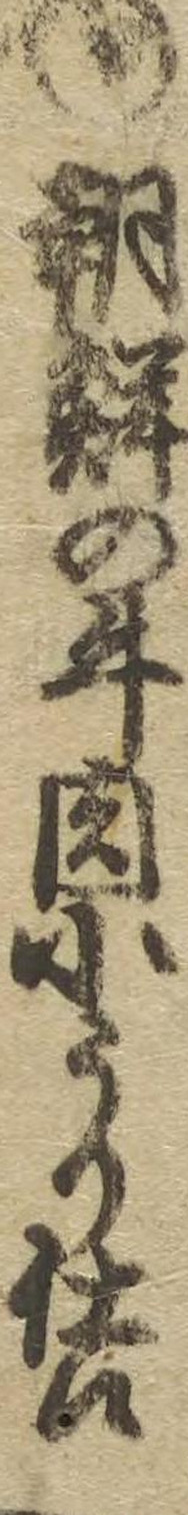○朝鮮の牛肉小うり仕候
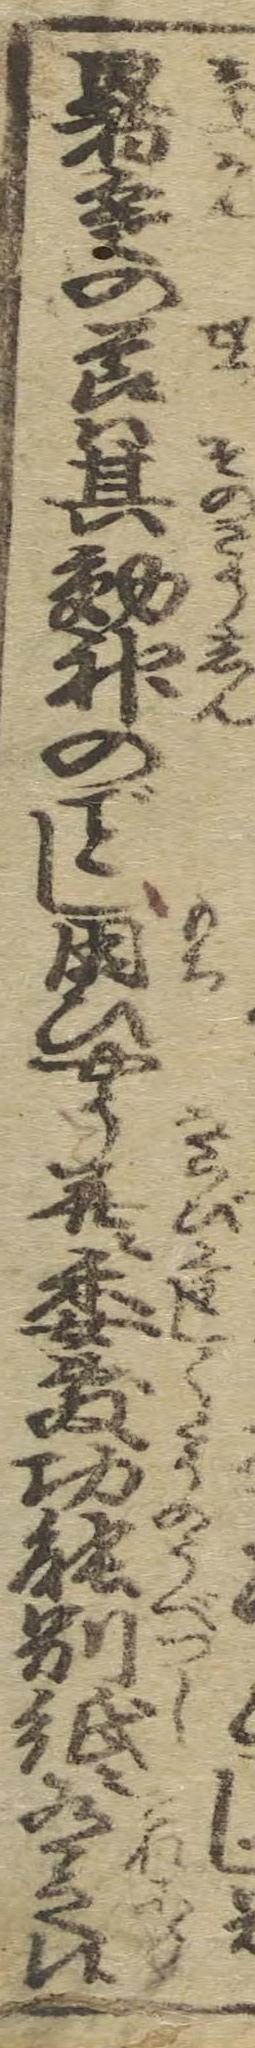暑寒の節は其効神のごとし用ひやう并ニ委敷功能別紙ニ有之候
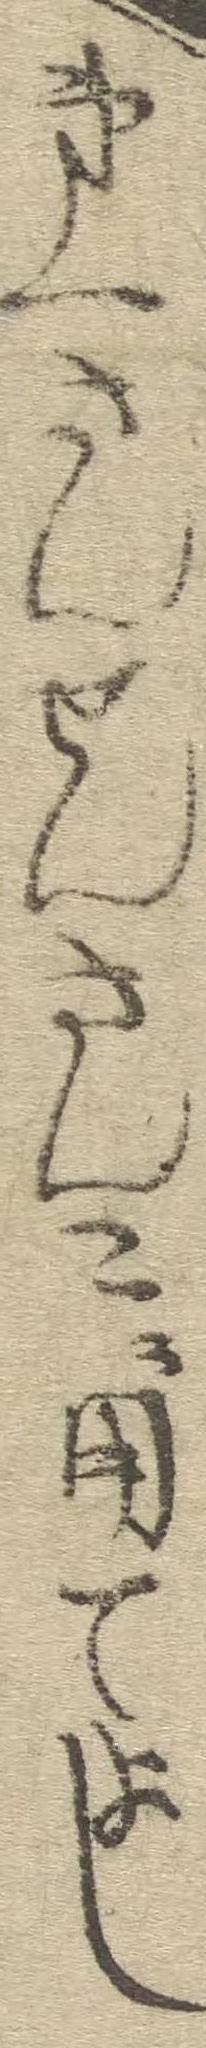第一さんせんさんこニ用てよし
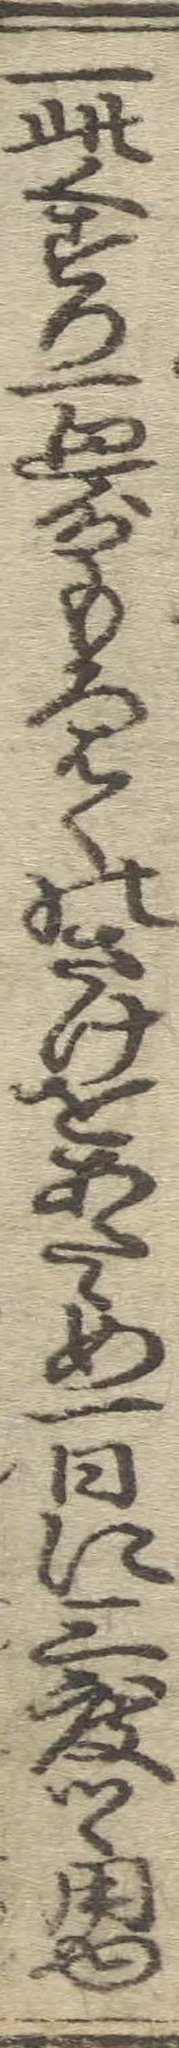一此くすり一廻分もろはくのさけをあたゝめ一日に三度ツヽ用ゆ
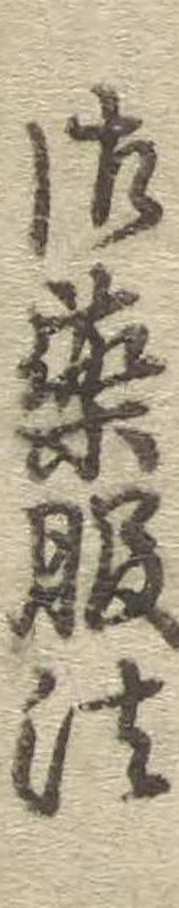御薬服法
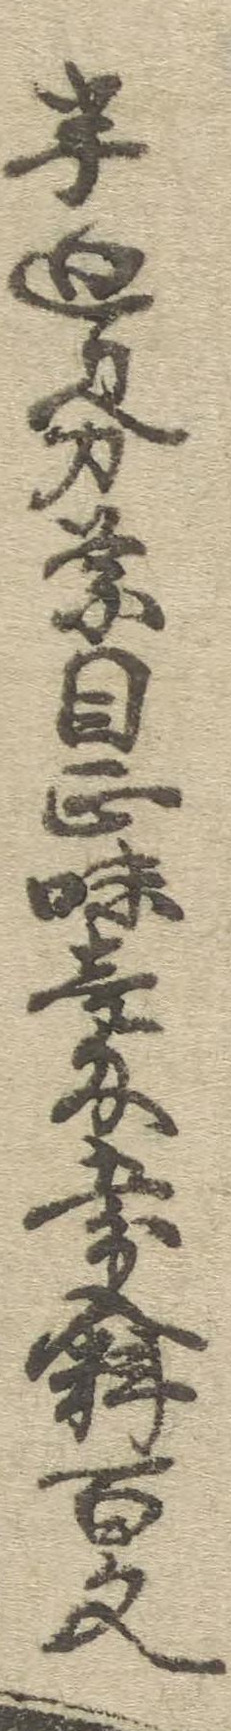半廻り分薬目正味壱匁五分入料百文
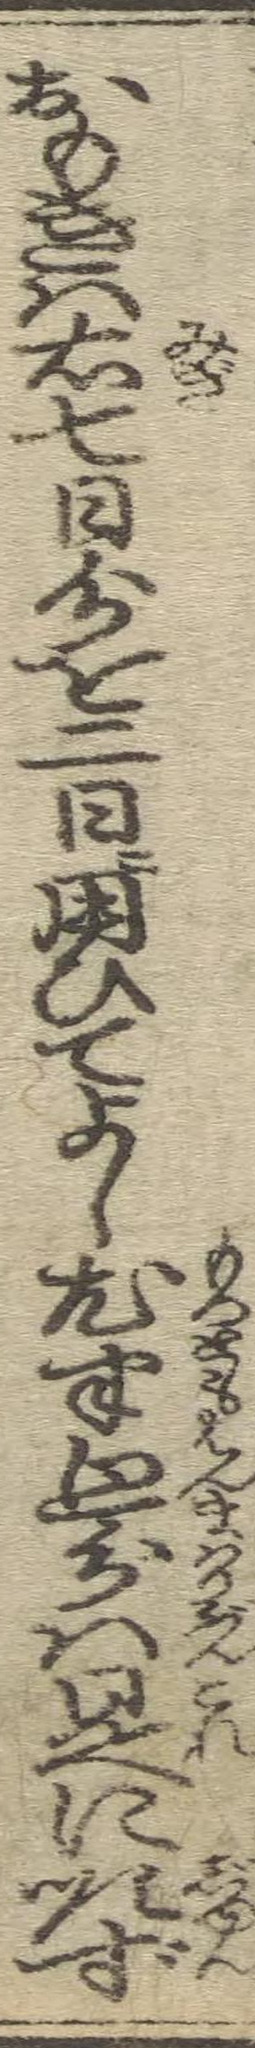おもきは右七日分を二日ニ用ひてよし尤半廻分は是に順ず
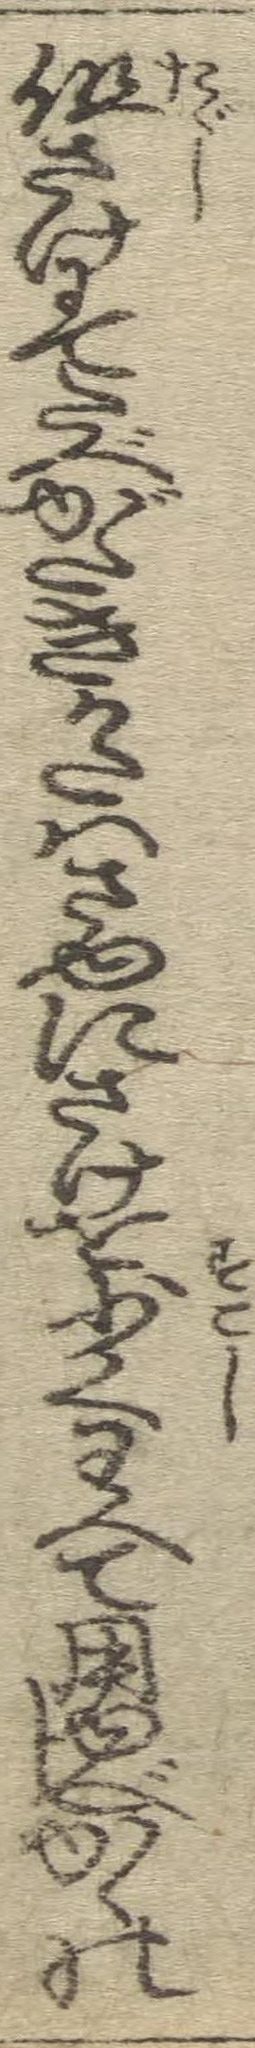但さけにてたべがたきかたはさゆにさけを少くわへて用ゆべしかくの
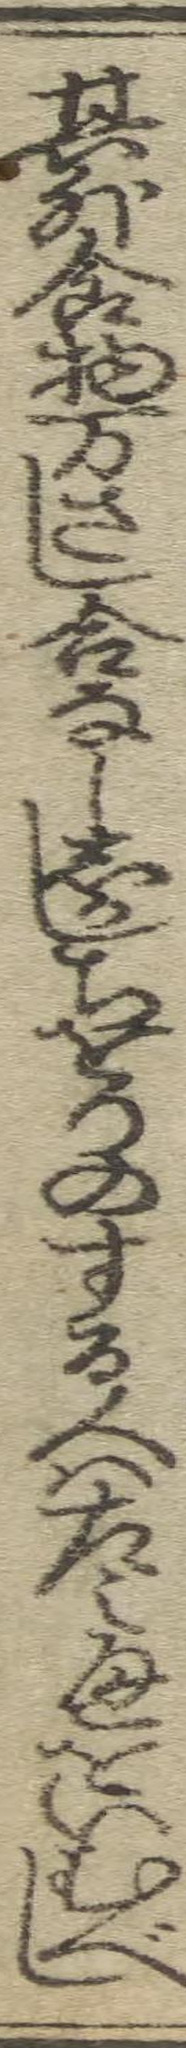其外食物さし合なししかしちをりのする人は左之通をいむべし
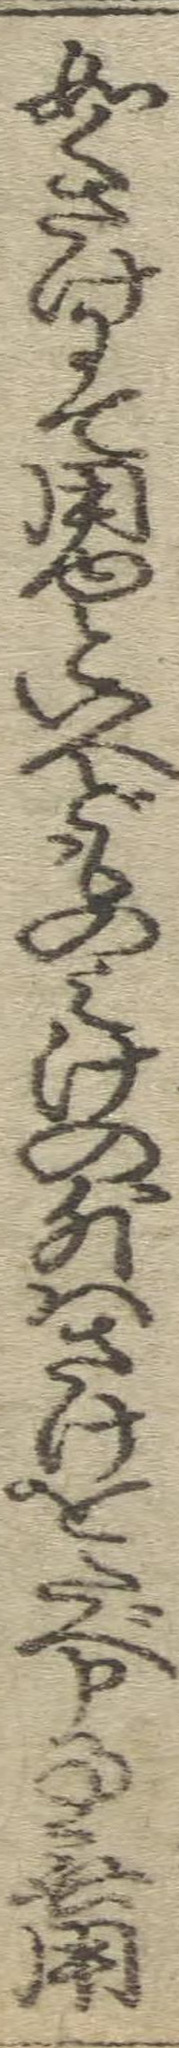如くさけにて用ゆといへどものみ汁の外はさけをたべ申事無用
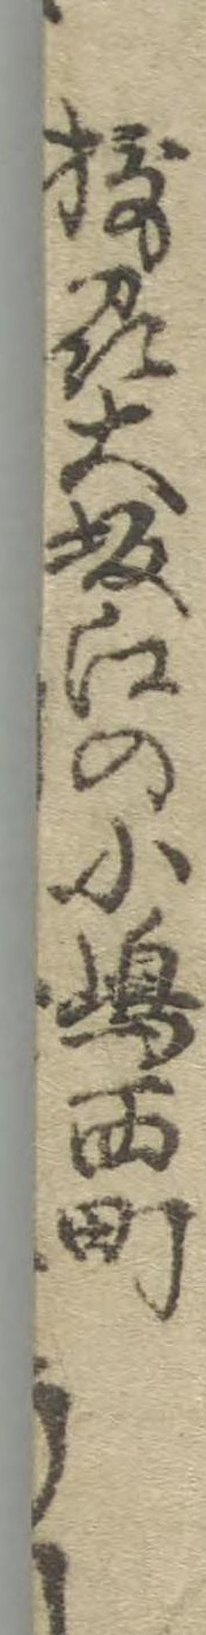摂州大坂江の小嶋西町
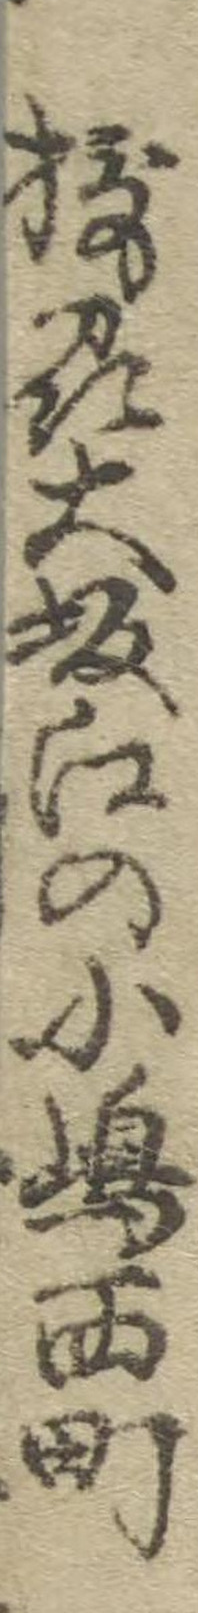摂州大坂江の小嶋西町
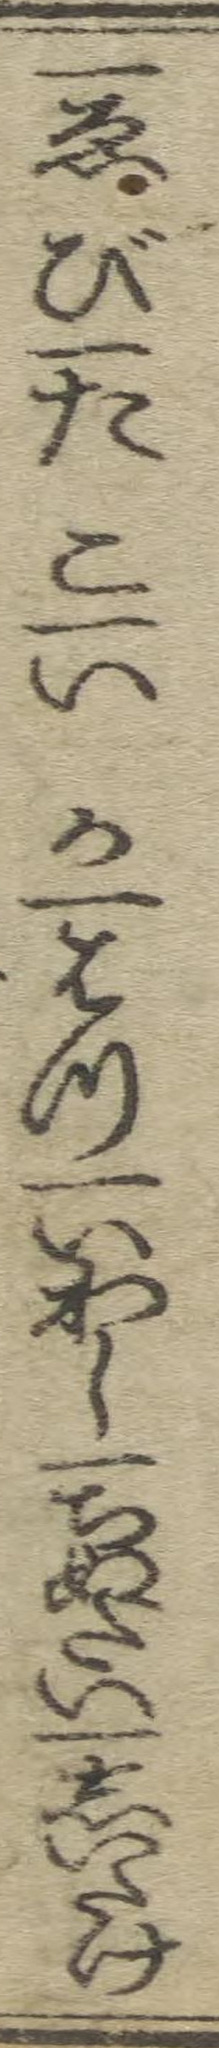一ゑび一たこ一いか一はつ一いわし一ちぬたい一しいたけ

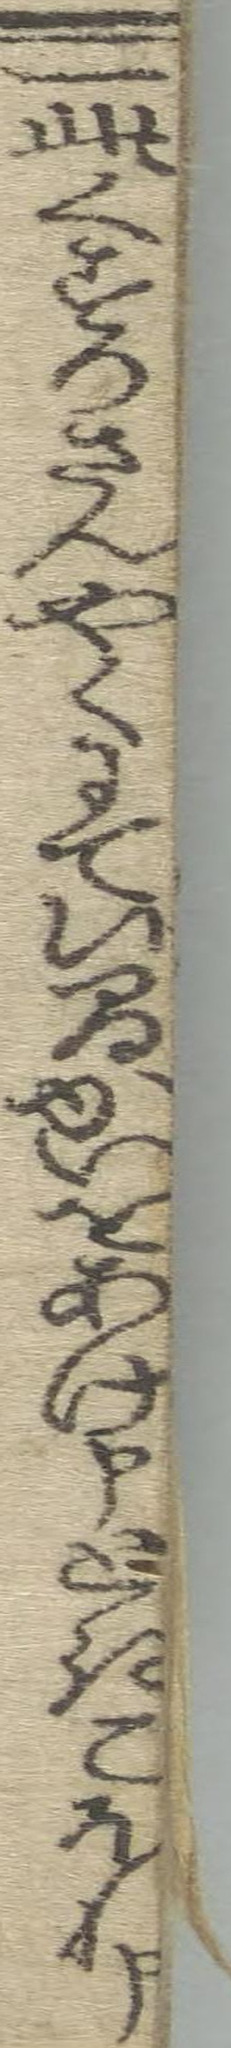一此くすりさんやくにて候間かいをあけ申ときこほれ申
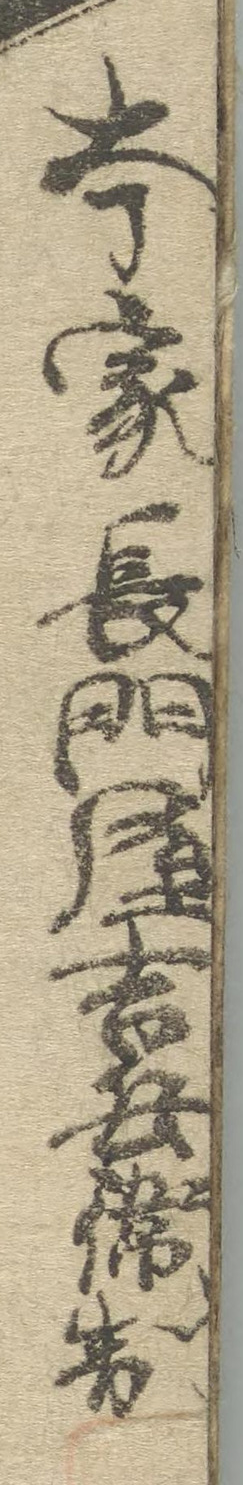本家長門屋吉兵衛制
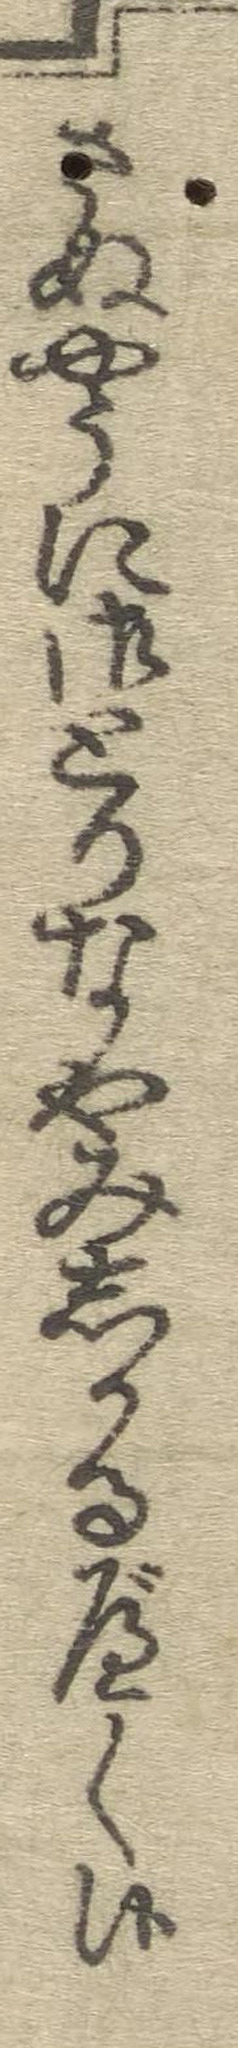さぬやうに御とりなやみしかるべく候
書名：浪華薬種問屋能書張交帖. 二
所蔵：国立国会図書館 National Diet Library, JAPAN
